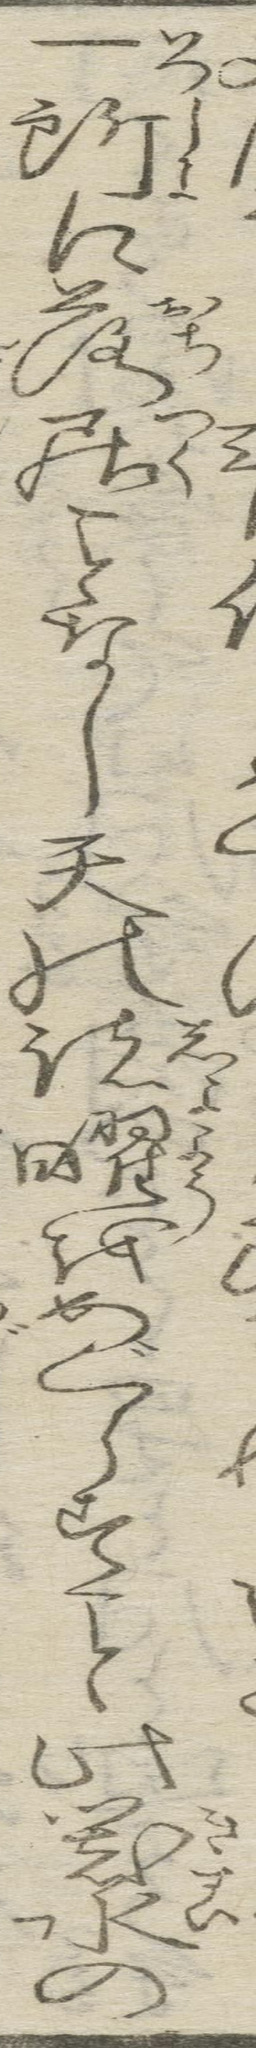一所に落居ことなし天の諸曜をめぐらすこと此器水の
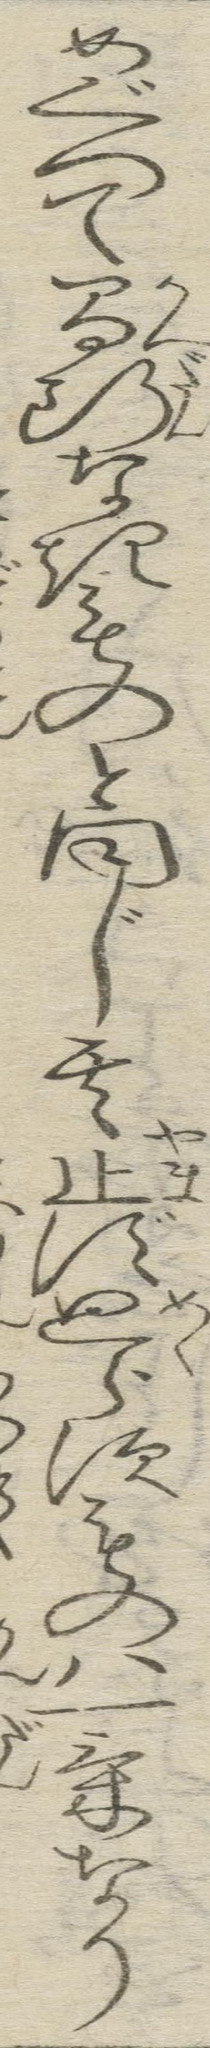めぐつて間断なきものと同じ其止ず廻らすものは一気なり
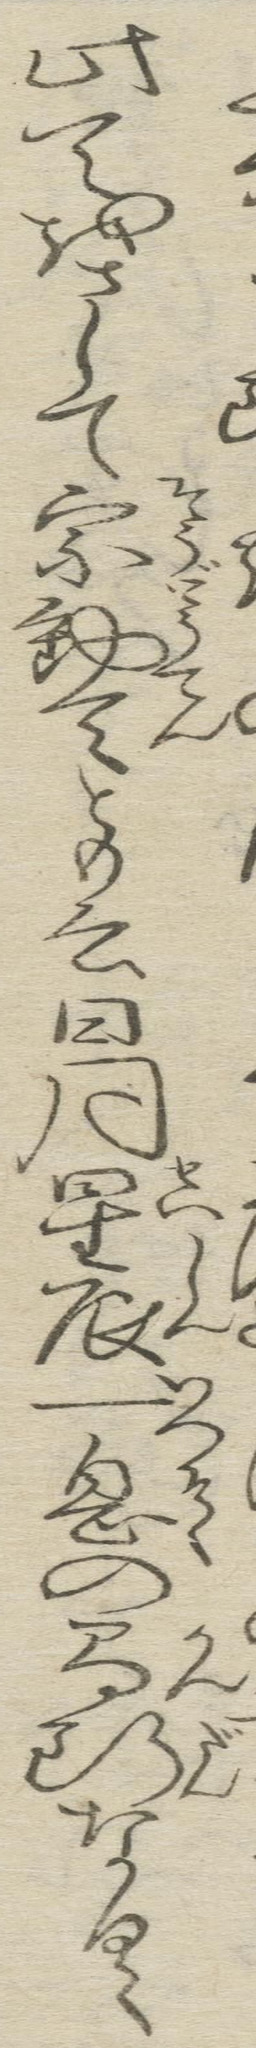此天をさして宗動天とも云日月星辰一息の間断なく
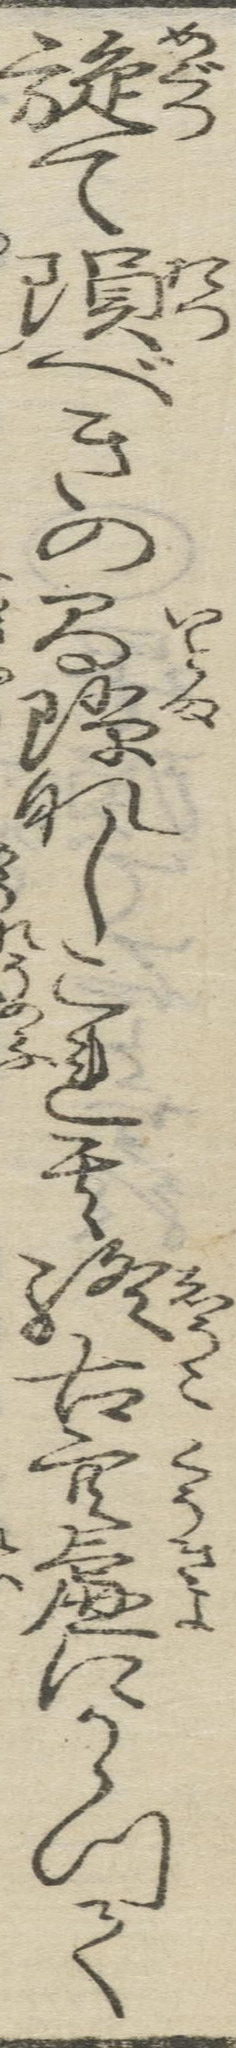旋て隕べきの間際なしこれ其終古空虚にかゝつて
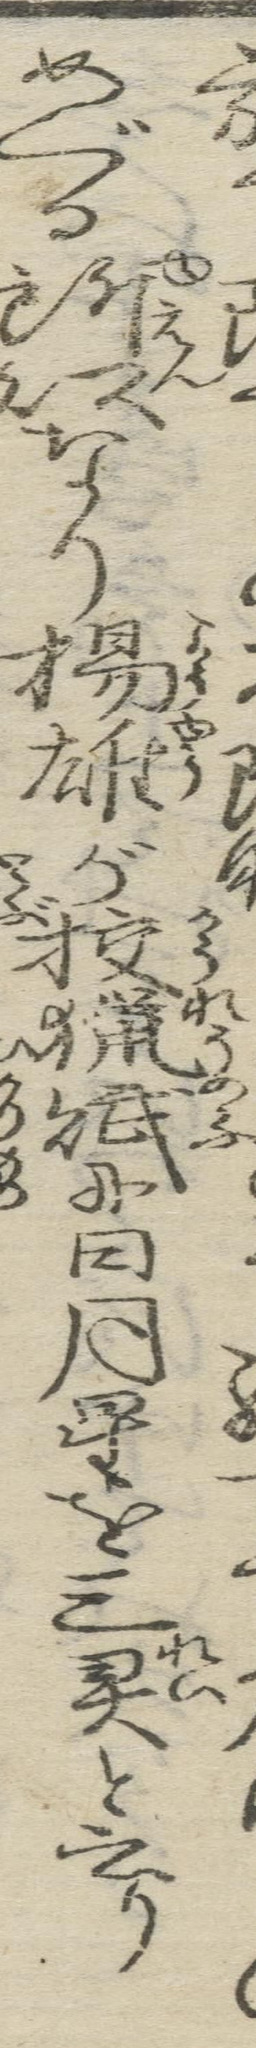めぐる所以なり楊雄が校猟賦に日月星を三霊と云り
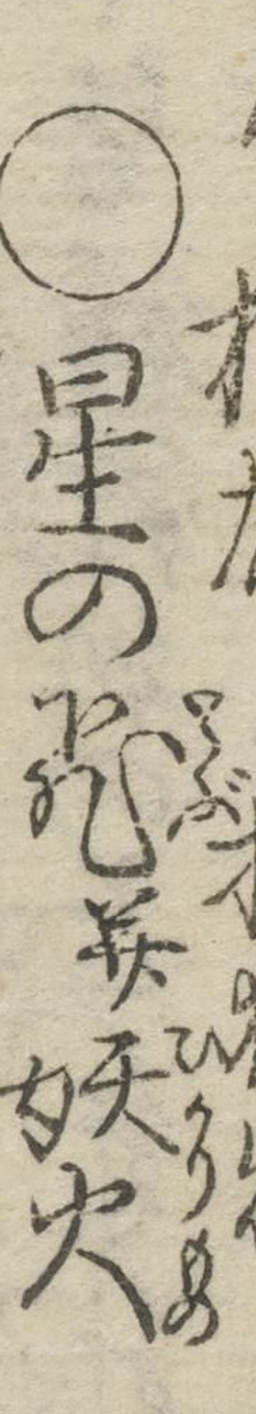○星の飛并妖火
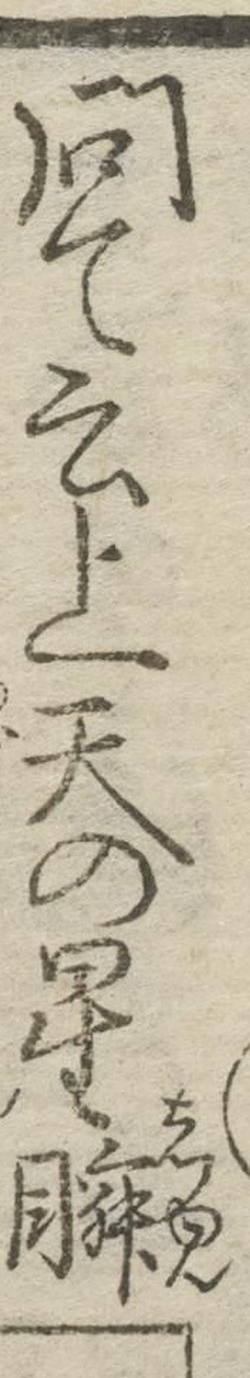問て云上天の星瞬
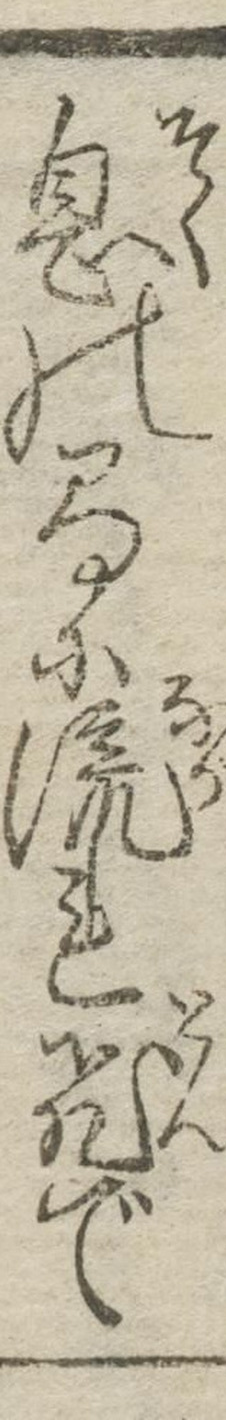息の間に流れ飛で
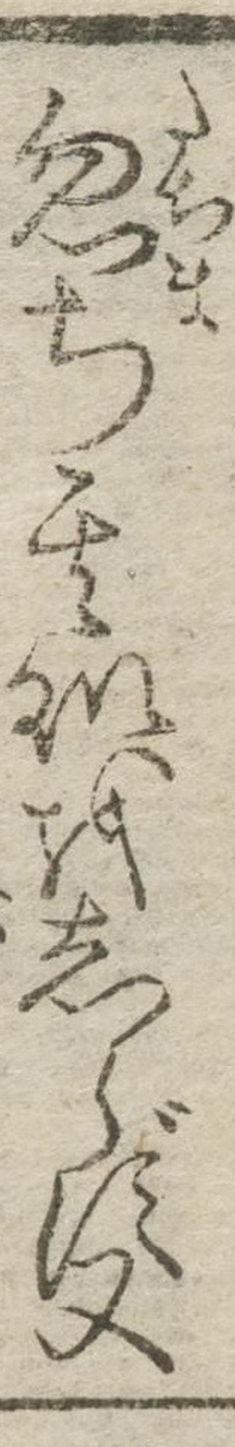忽ち其処をしらず又
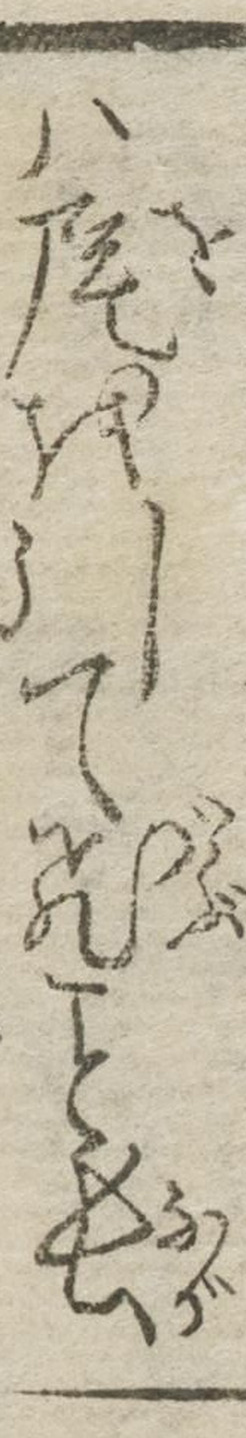は尾を引て飛こと長
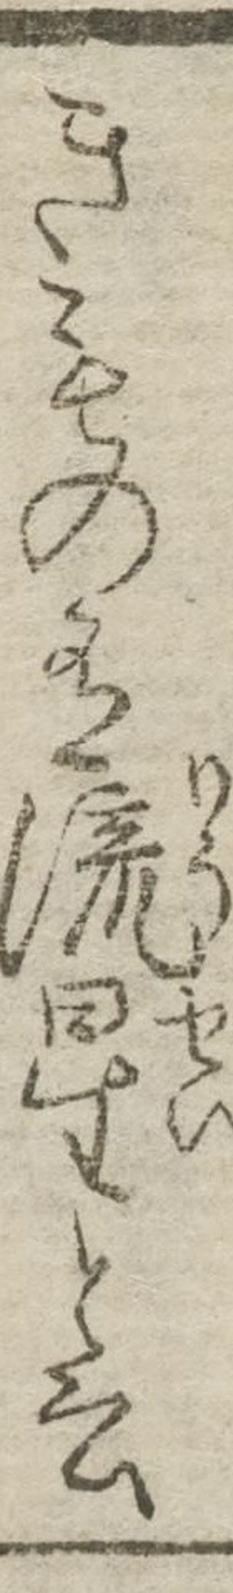きもの有流星と云
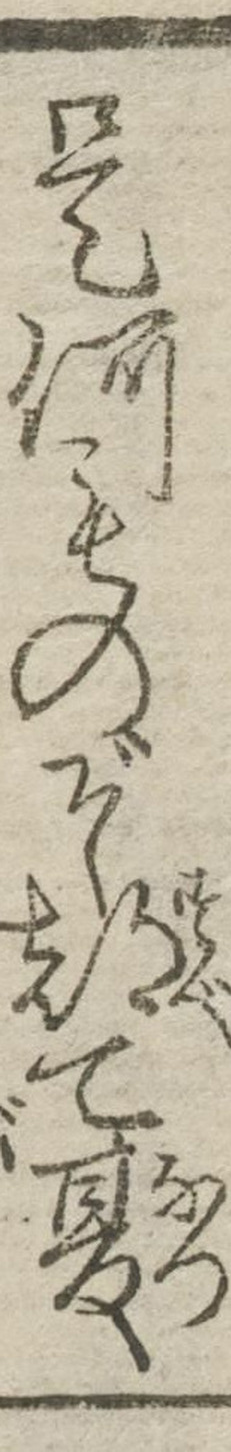是何ものぞ都て夏
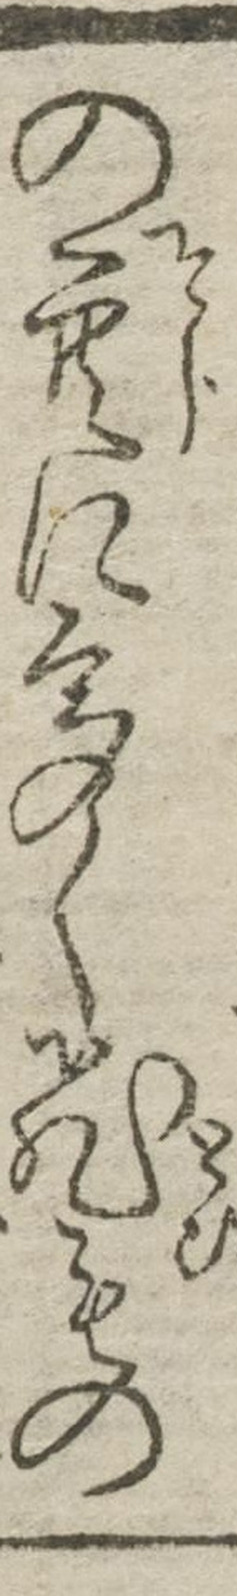の空に多く飛もの
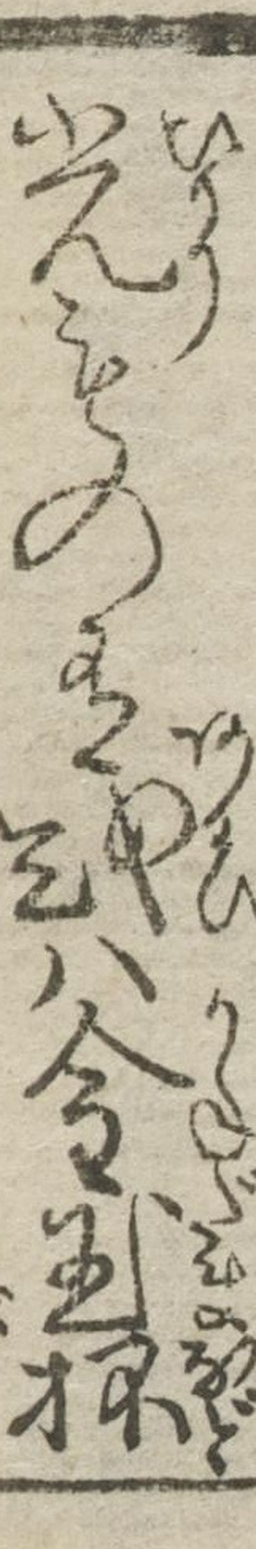光もの有或は金玉抔
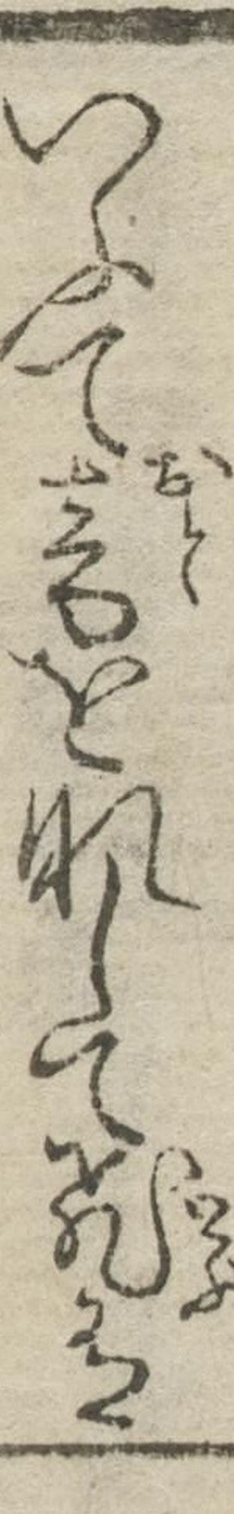いふて音をなして飛有
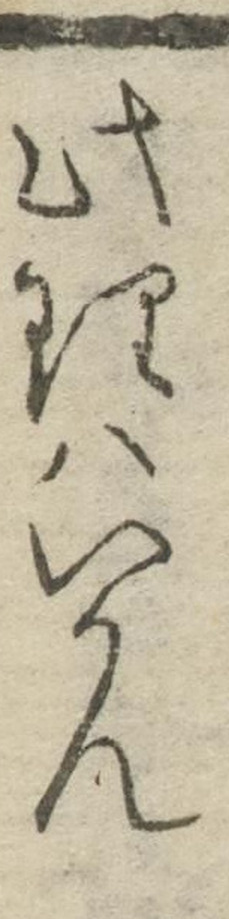此理はいかん
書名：訓蒙天地辨　天
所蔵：東京大学地震研究所図書室 Earthquake Research Institute Library, The University of Tokyo, JAPAN
